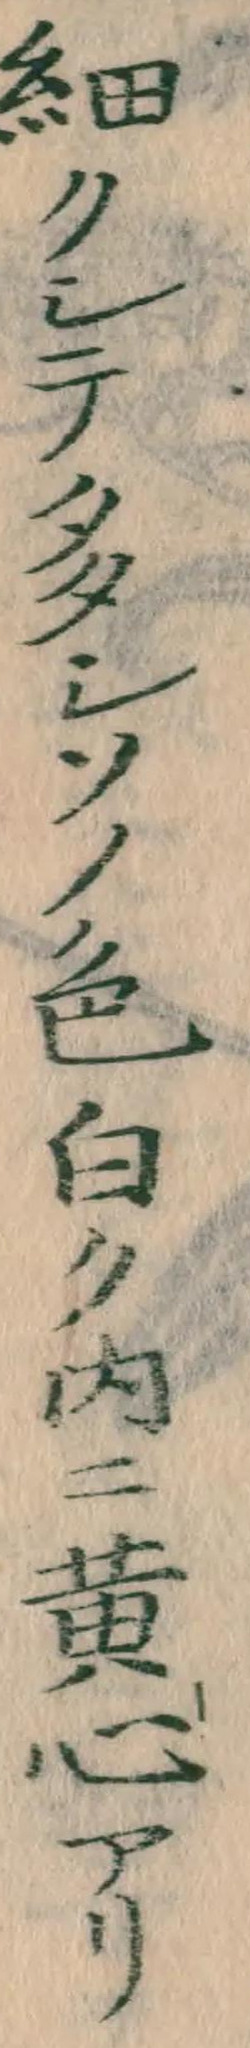細クシテ多シソノ色白ク内ニ黄-心アリ
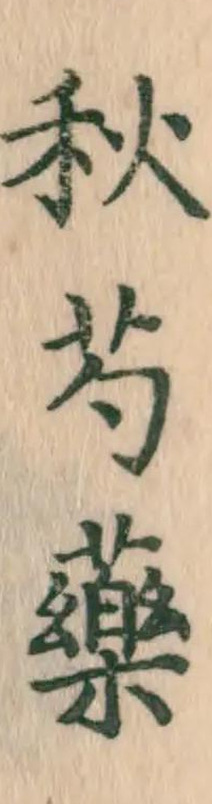秋芍薬

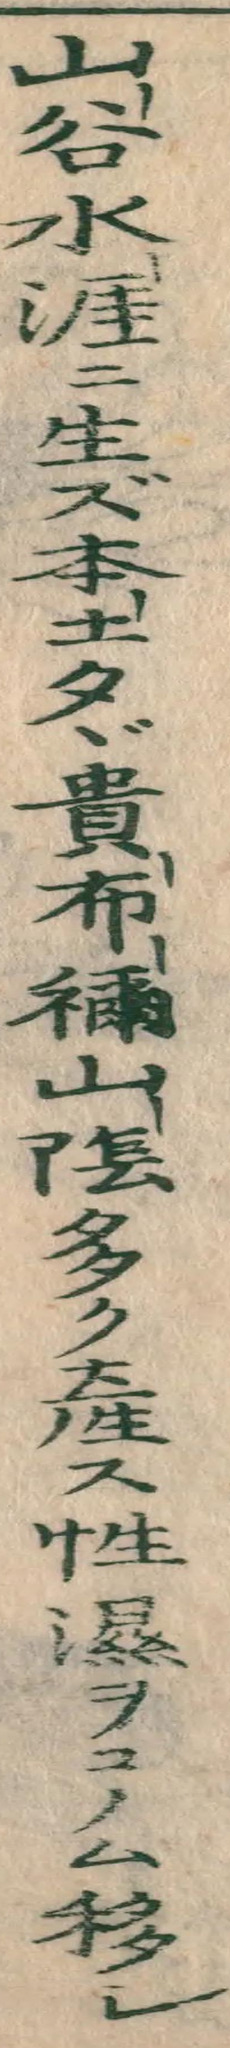山-谷水-涯ニ生ズ本-土タヾ貴-布-祢山-陰多ク産ス性湿ヲコノム移シ
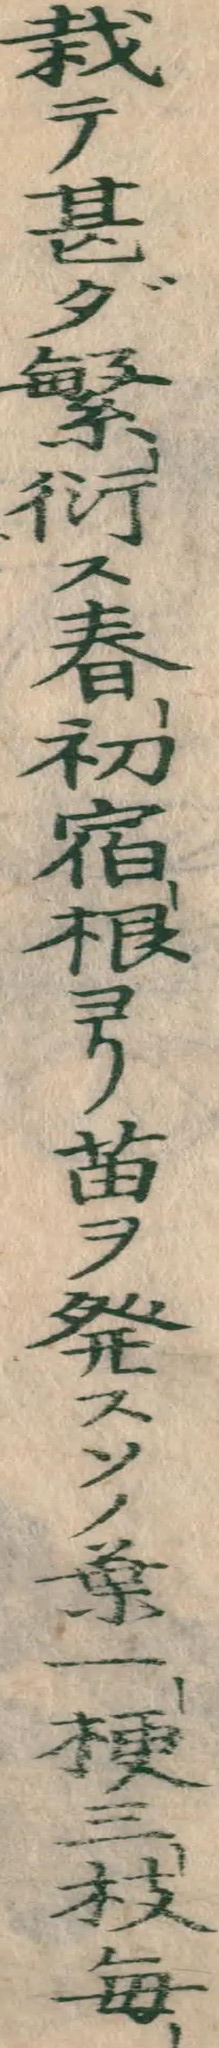栽テ甚ダ繁-衍ス春-初宿-根ヨリ苗ヲ発スソノ葉一-梗三-枝毎-
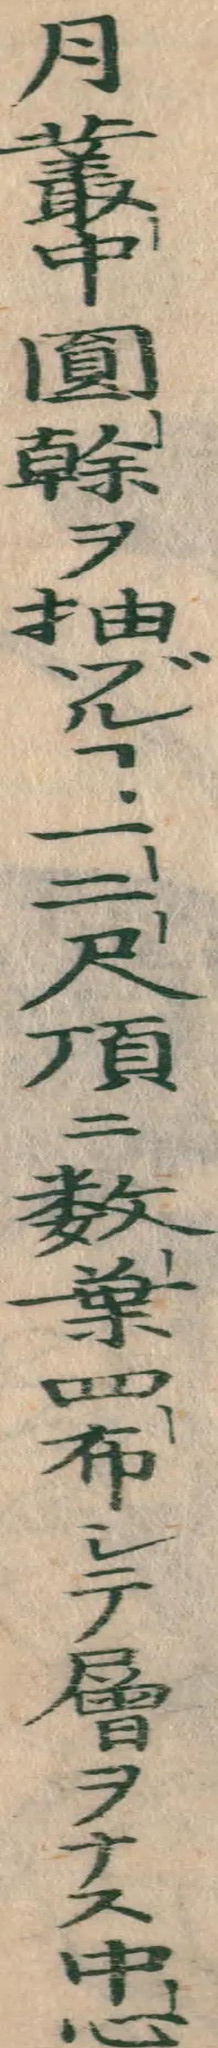月叢-中円-幹ヲ抽ヅルコト一-二-尺頂ニ数-葉四-布シテ層ヲナス中-心
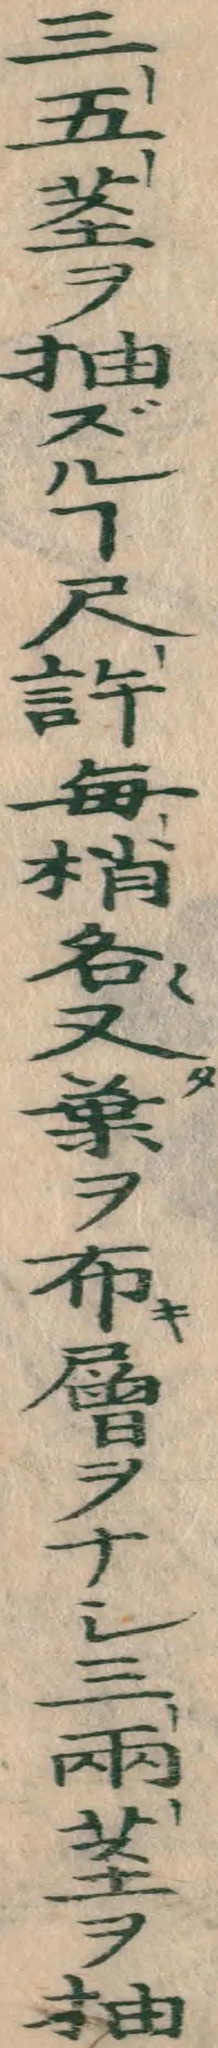三-五-茎ヲ抽ズルコト尺-許毎-梢各〱又葉ヲ布層ヲナシ三-両-茎ヲ抽
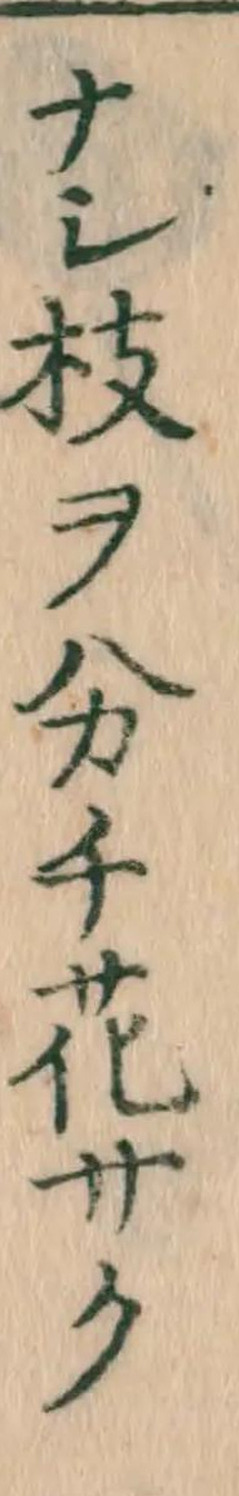ナシ枝ヲ分チ花サク
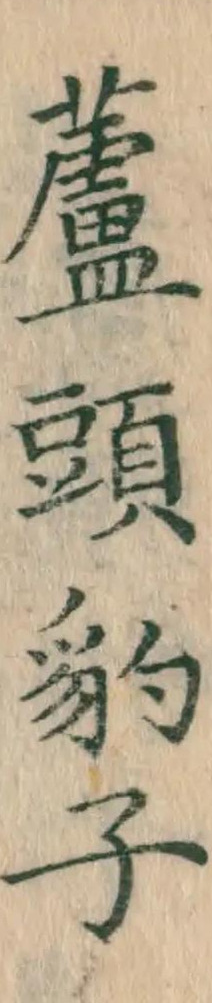芦頭豹子

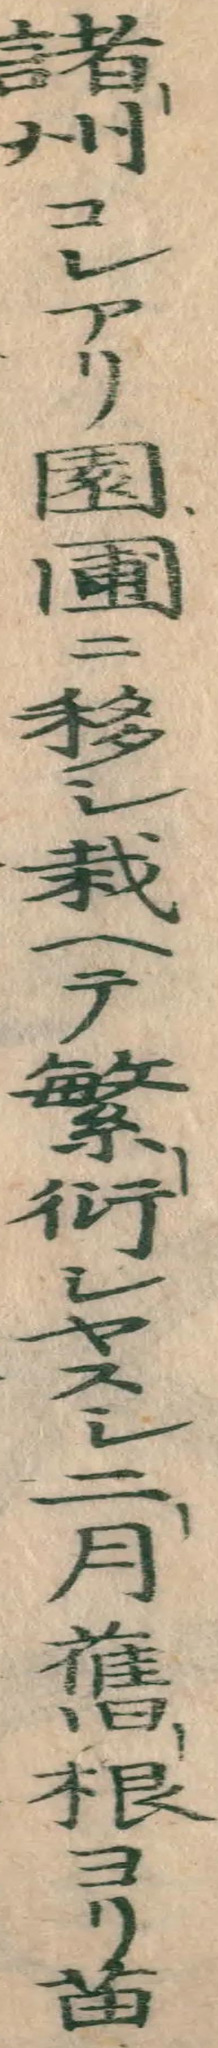諸-州コレアリ園-圃ニ移シ栽ヘテ繁-衍シヤスシ二-月旧-根ヨリ苗
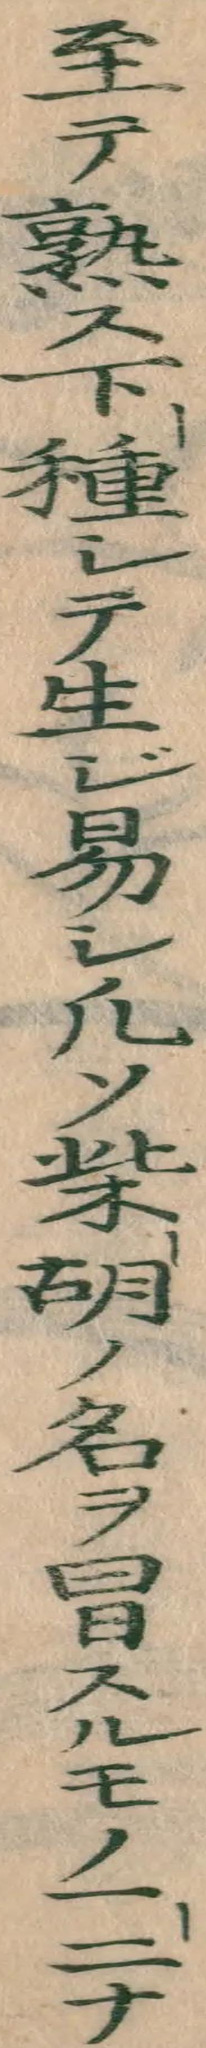至テ熟ス下-種シテ生ジ易シ凡ソ柴-胡ノ名ヲ冒スルモノ一-二ナ
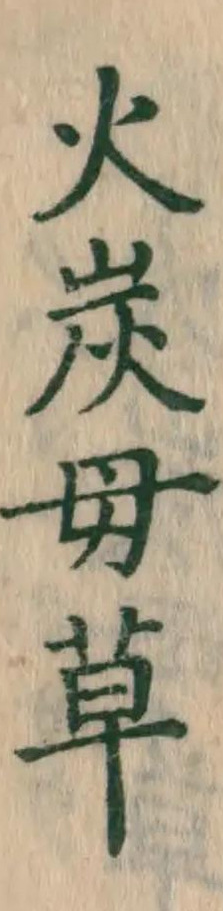火炭母草

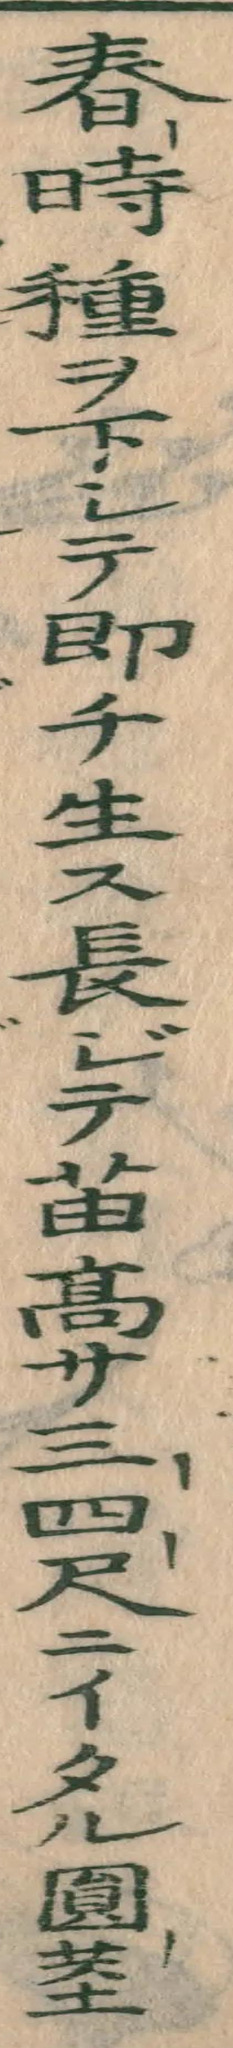春-時種ヲ下シテ即チ生ス長ジテ苗高サ三-四-尺ニイタル円-茎
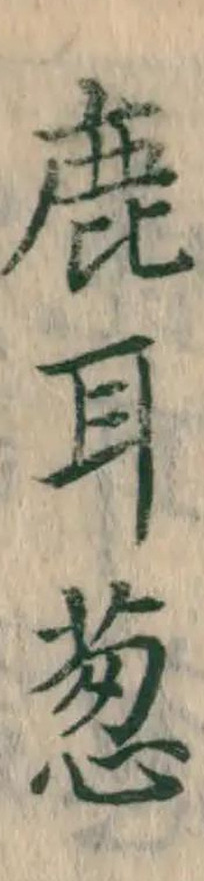鹿耳葱

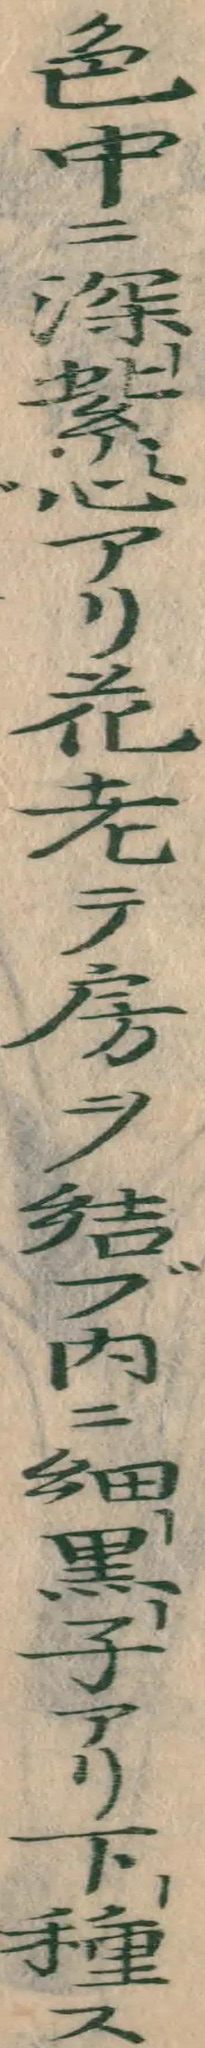色中ニ深-紫-心アリ花老テ房ヲ結ブ内ニ細-黒-子アリ下-種ス
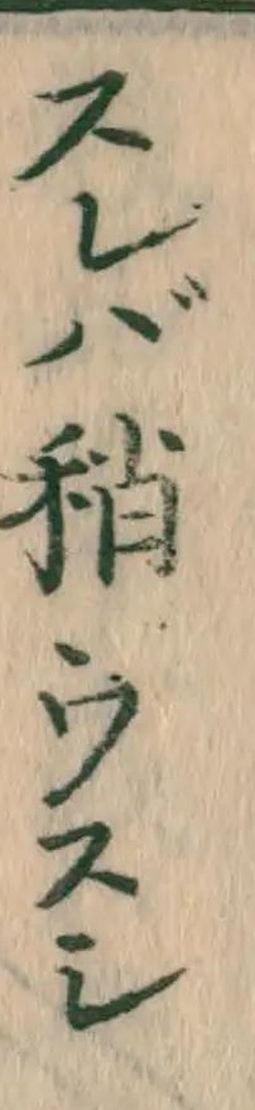スレバ稍ウスシ
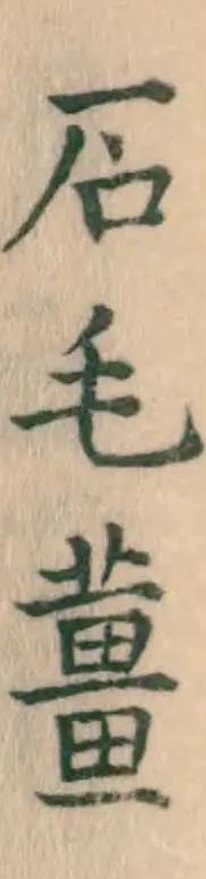石毛薑
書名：花彙 草部4巻木部4巻. [1]
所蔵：国立国会図書館 National Diet Library, JAPAN
